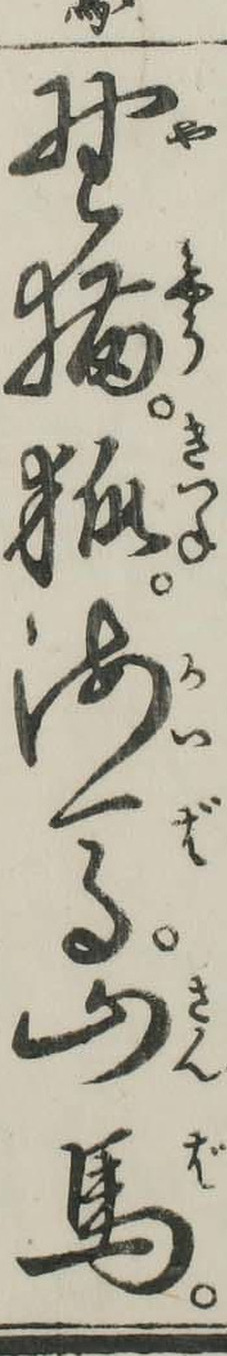野猫。狐。海馬。山馬。
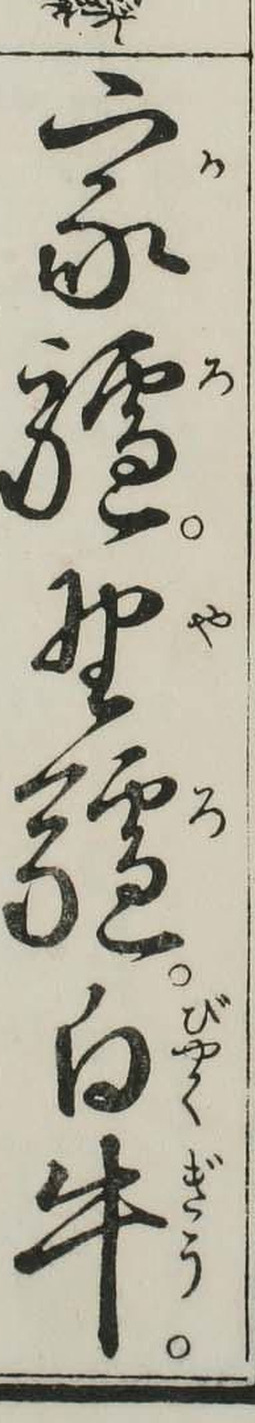家驢。野驢。白牛。
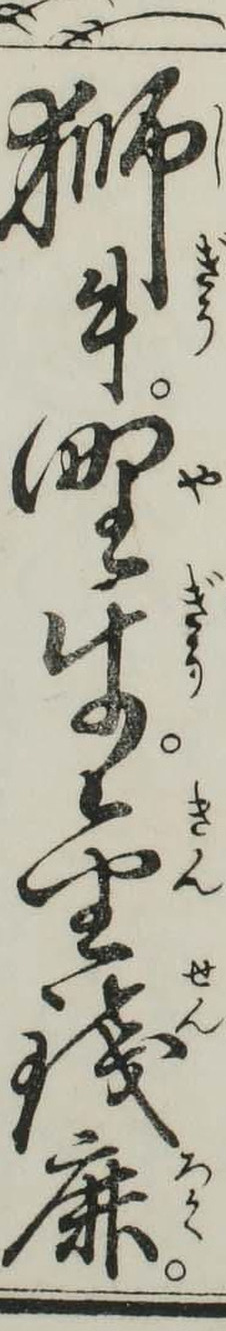獅牛。野牛。金銭鹿。
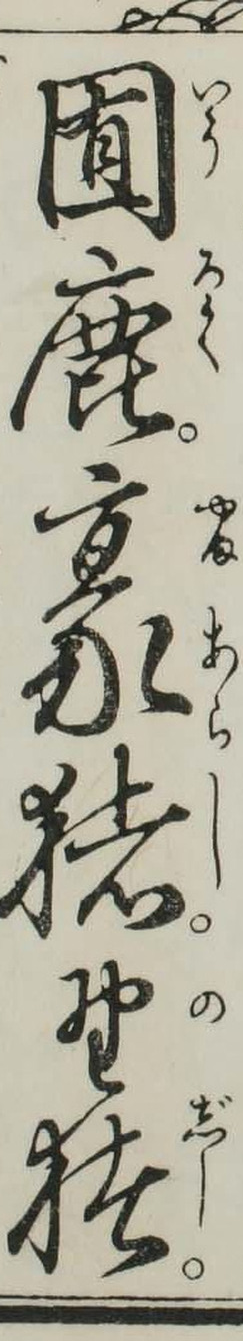囿鹿。豪猪。野猪。

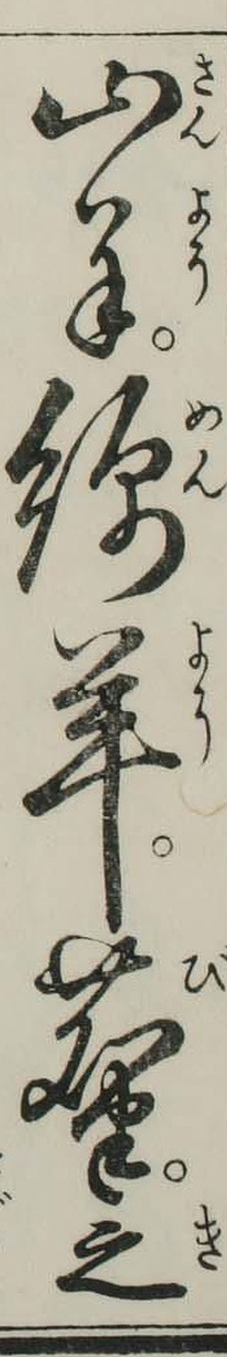山羊。綿羊。麋。之
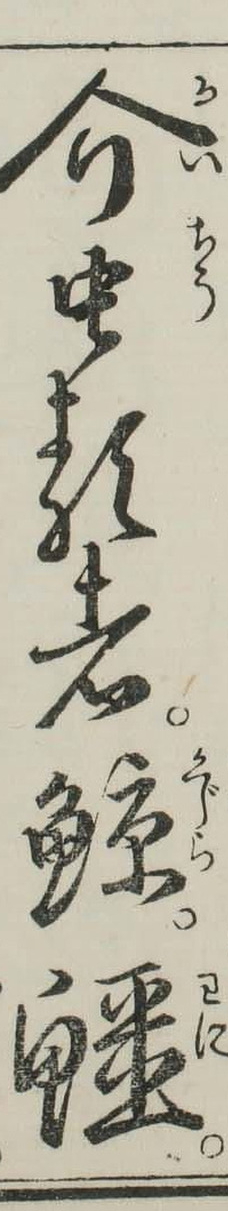介虫類は。鯨。鱷。

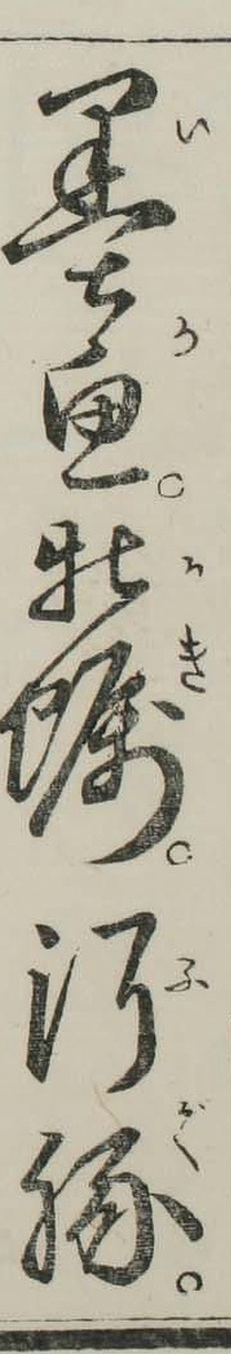墨魚。牡蠣。河豚。
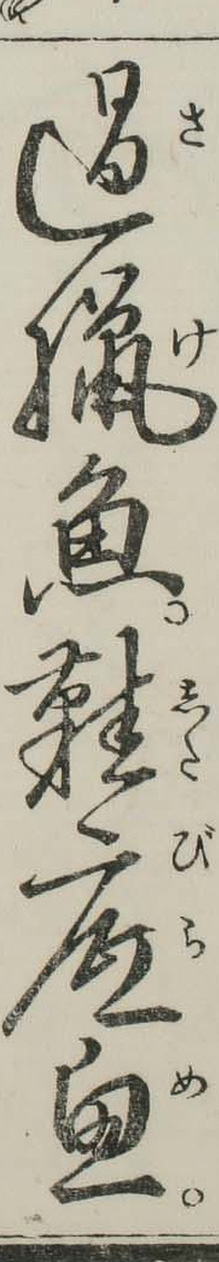過蝋魚。鞋底魚。
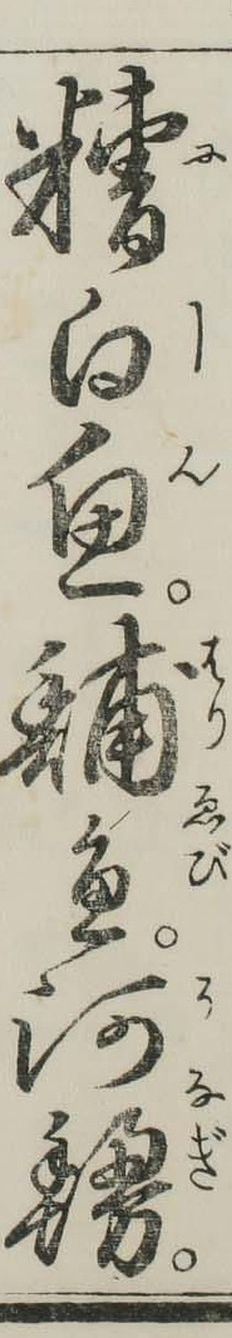糟白魚。鯆魚。河鰻。
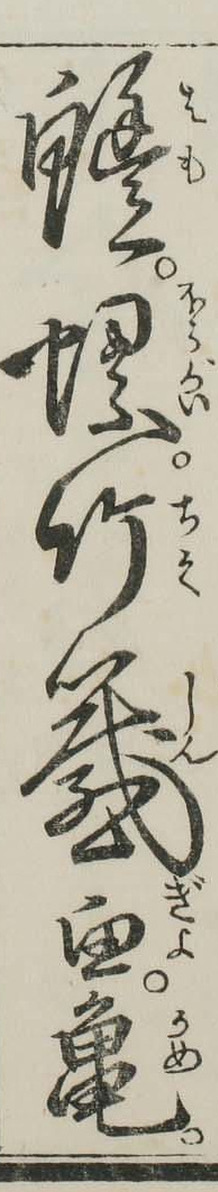鱧。螺。竹鍼魚。亀。
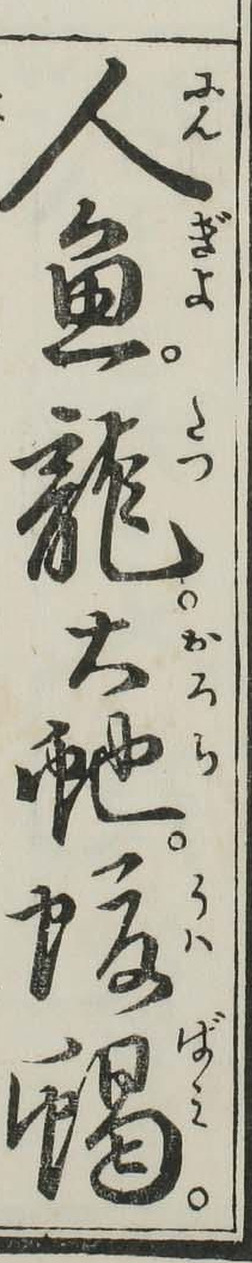人魚。龍。大蛇。蝮蝎。
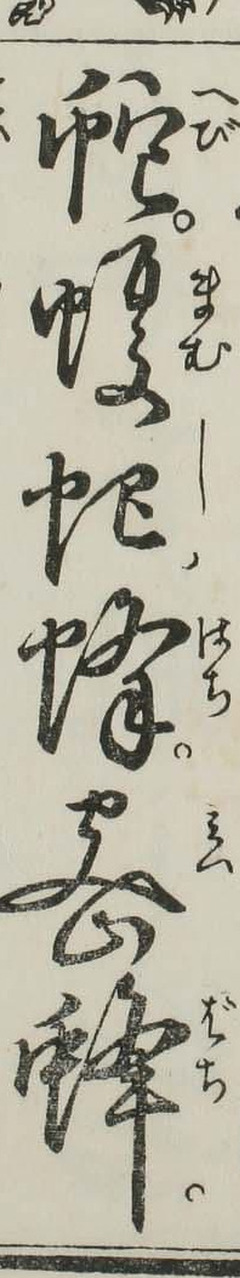蛇。蝮蛇。蜂。蜜蜂。
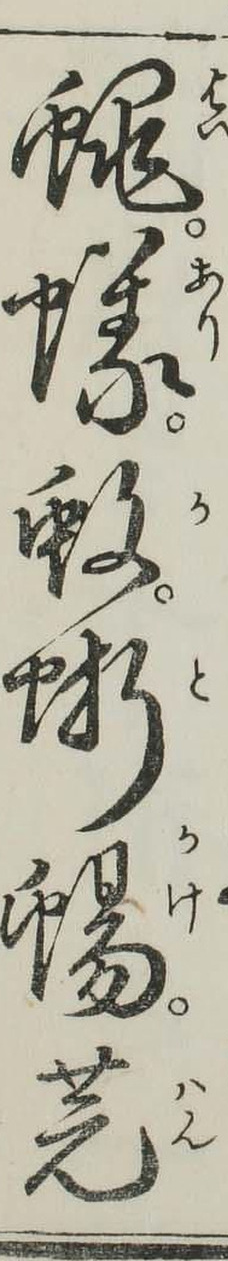蠅。蟻。蚊。蜥蜴。芫
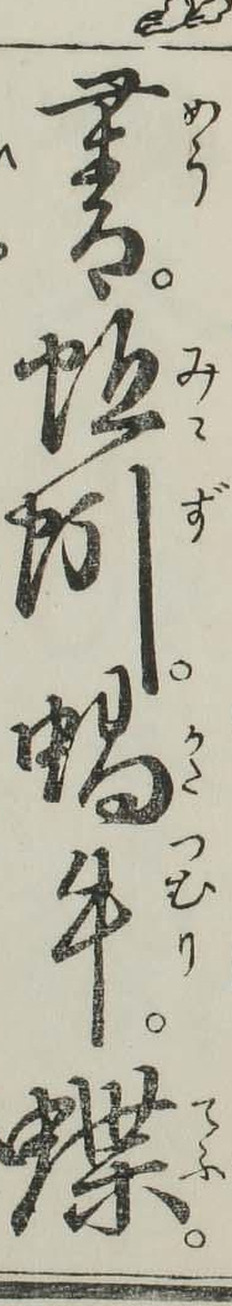青。蚯蚓。蝸牛。蝶。
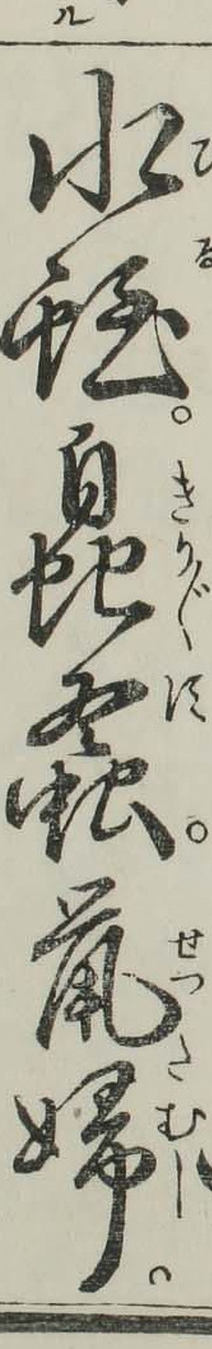水蛭。𧑉螽。鼠婦。

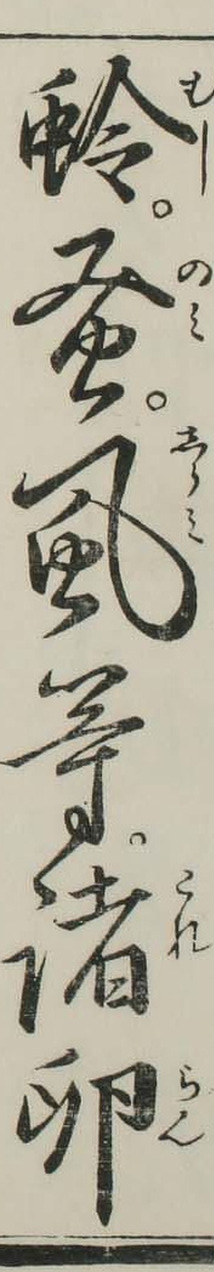蛉。蚤。虱等。諸卵
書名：開化往来
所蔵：東京学芸大学教育コンテンツアーカイブ
